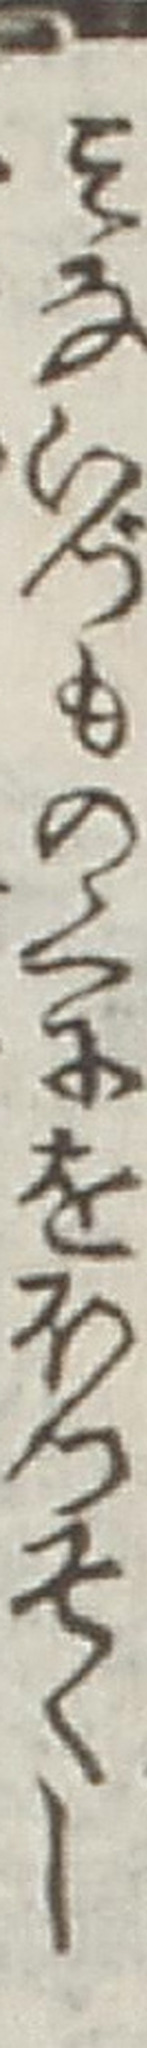みないづものくにをほつそくし
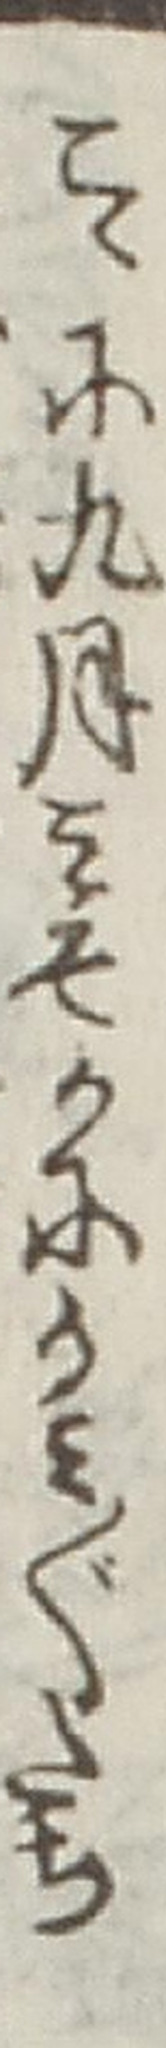ここに九月みそかにかみ〴〵たち
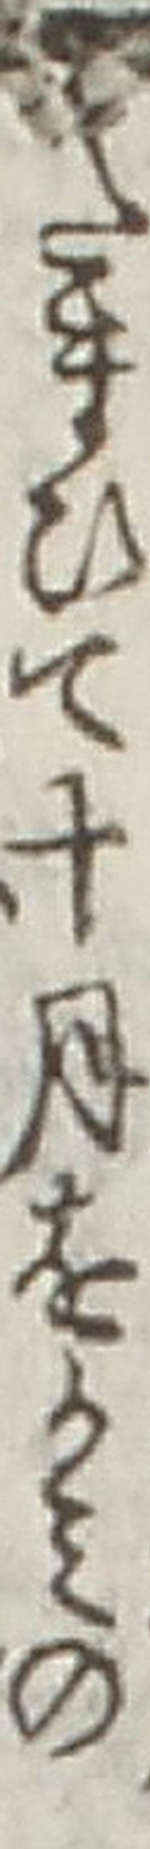たまひて十月をかみの
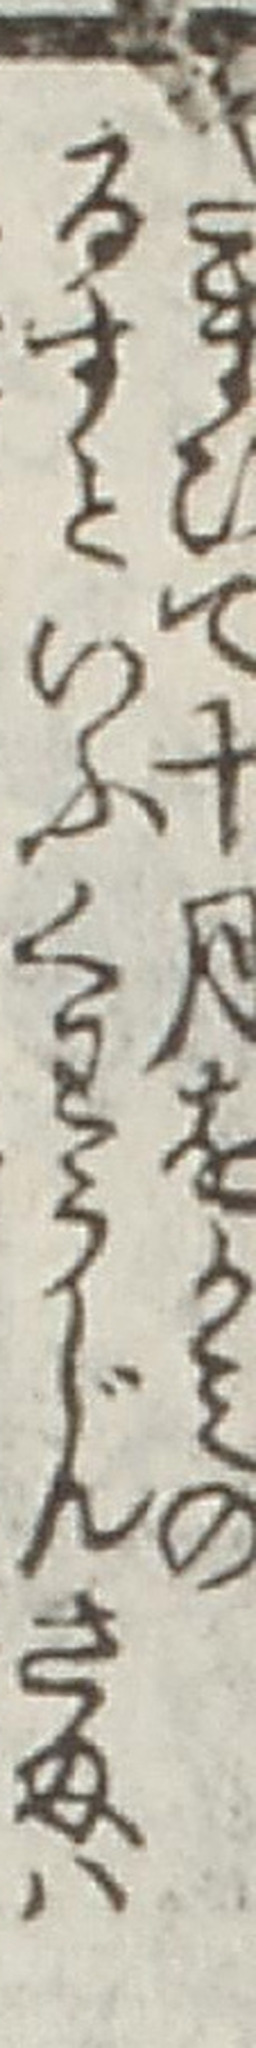るすといふくらうじんさまは
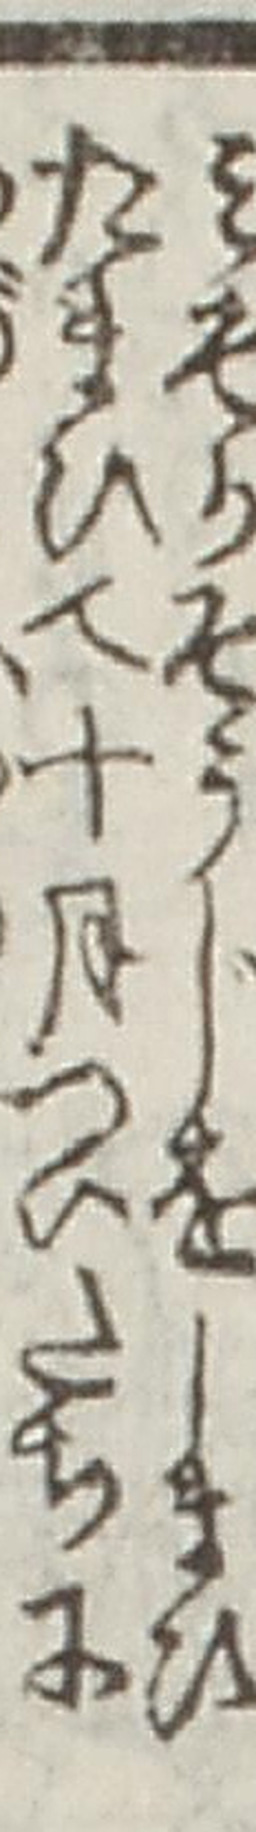たまひて十月ついたちに
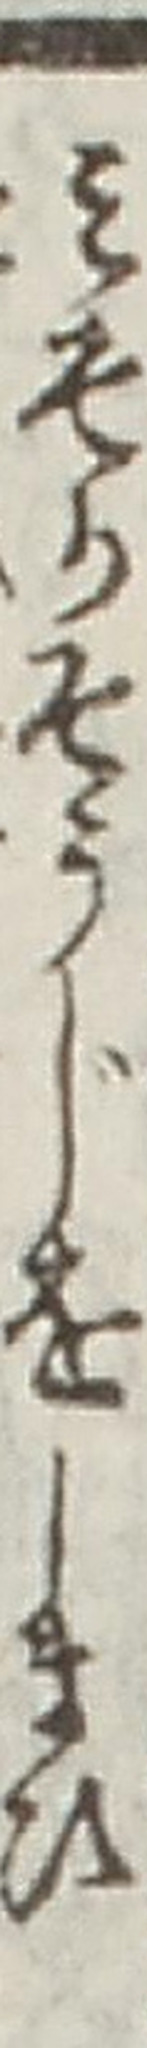みそかそうじをしまひ
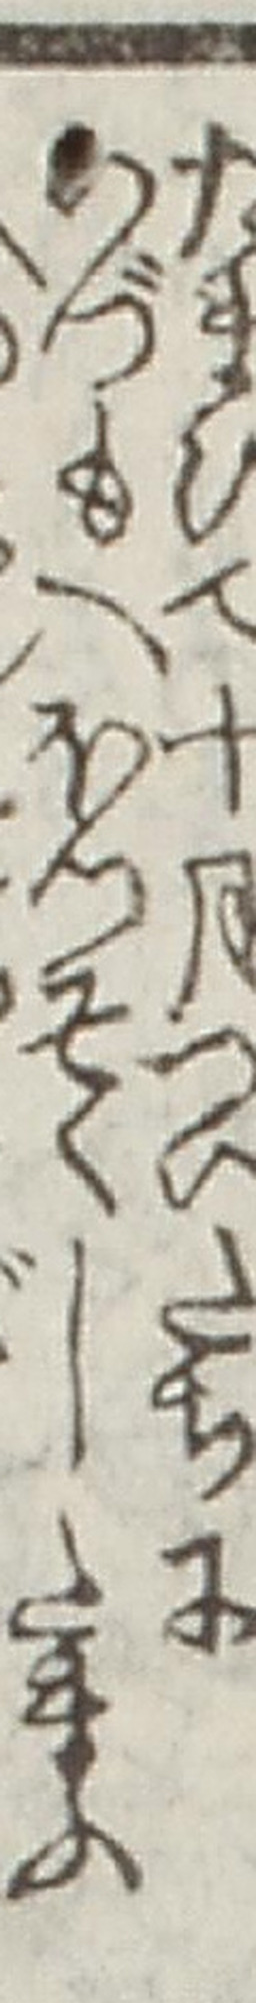いづもへほつそくしたまふ
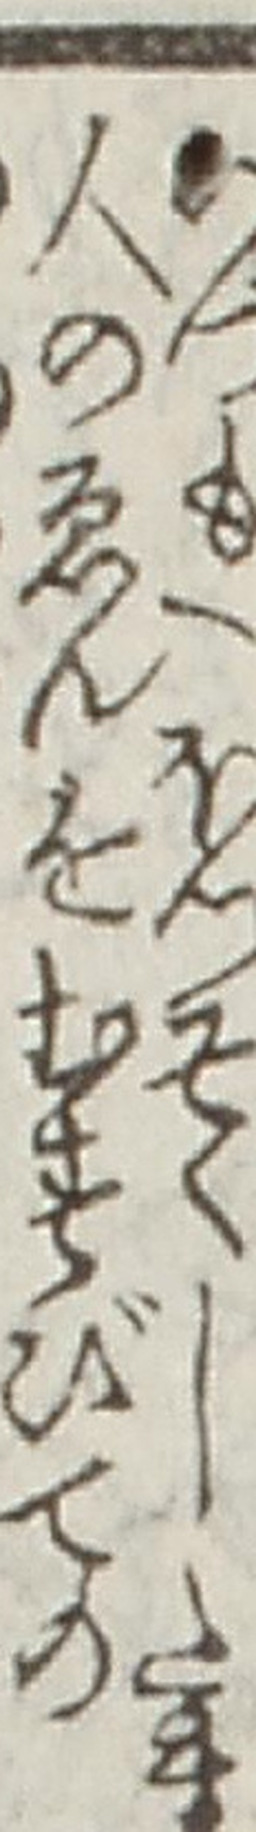人のゑんをむすびての
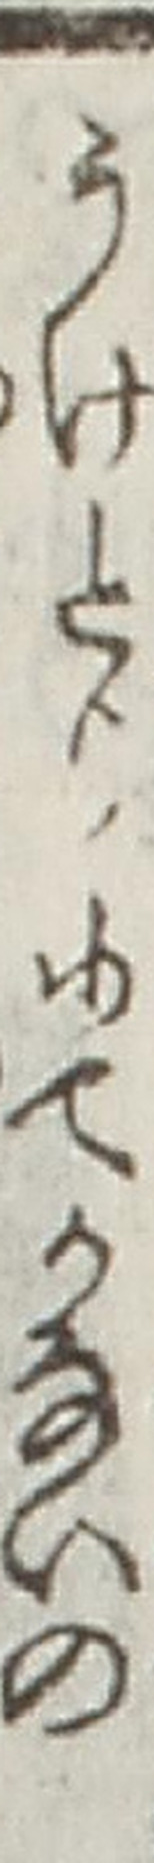うけとりにてかないの
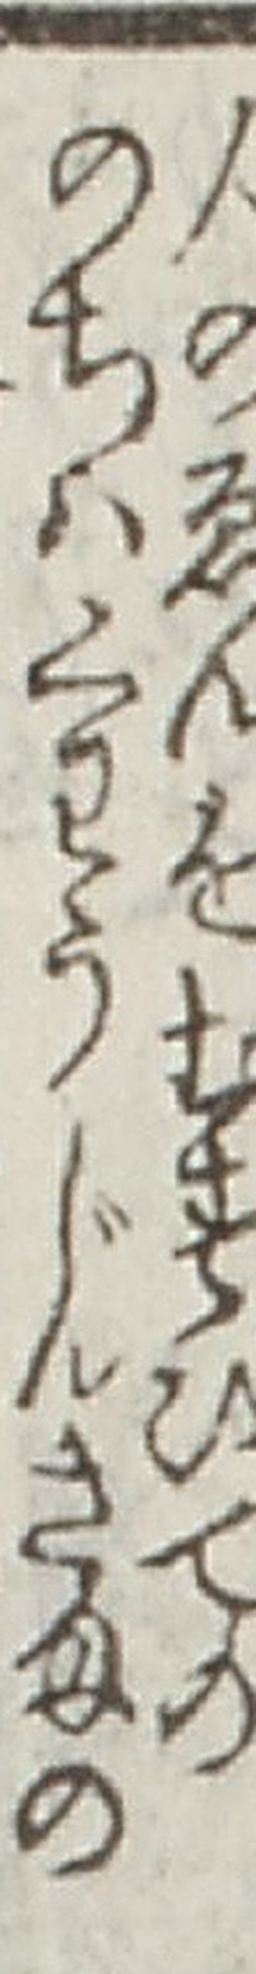のちはくわじんさまの
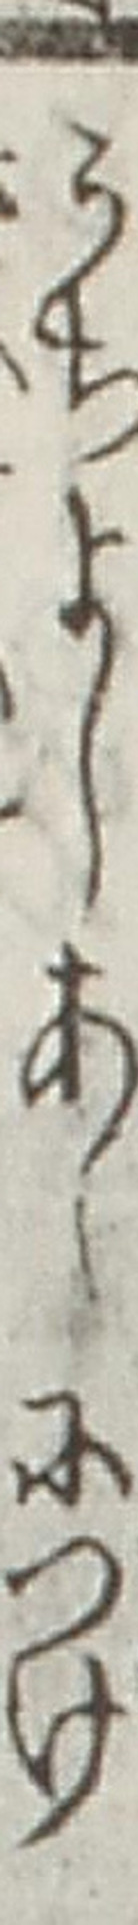うちよしあしにつけ
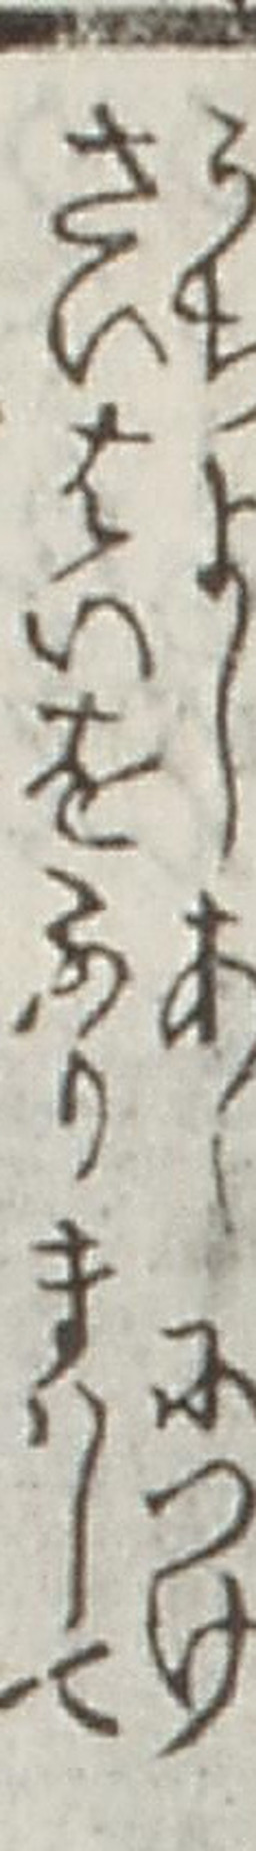さいはいをふりまはして
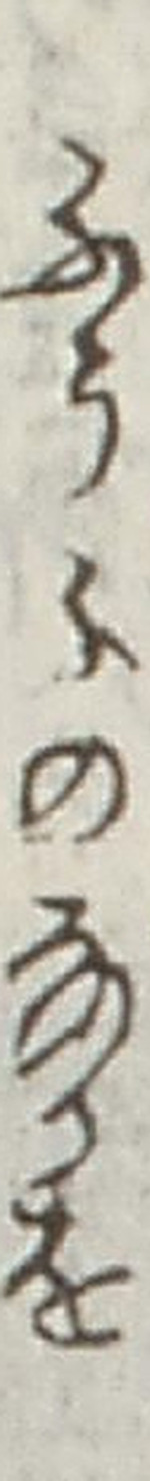ふうふのなかを
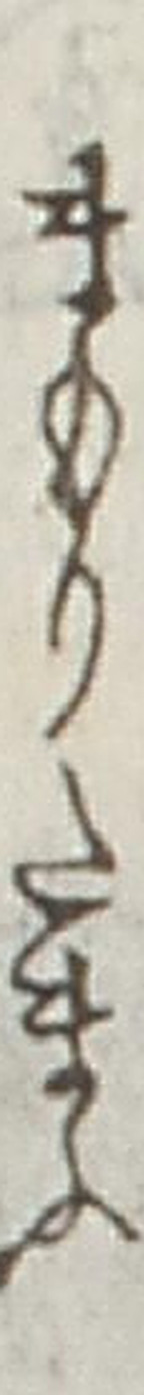まもりたまふ
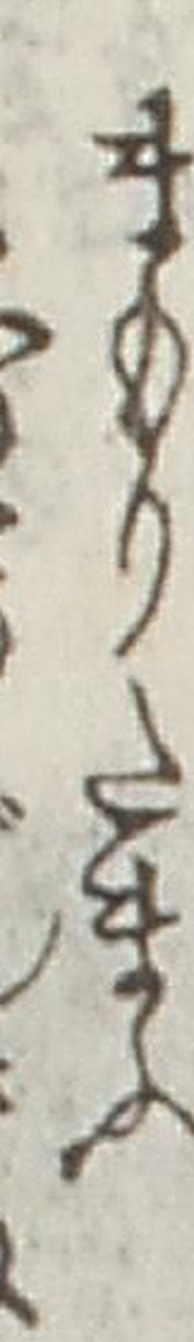まもりたまふ
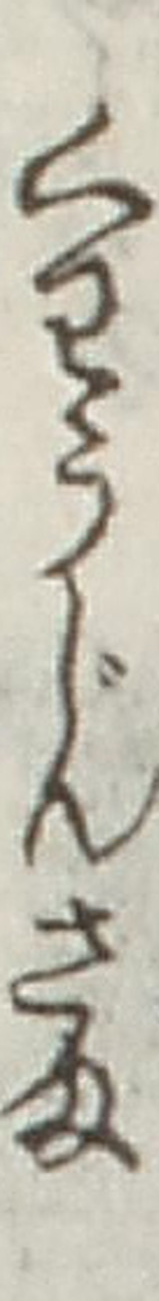くわうじんさま
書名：三世相出雲當座帳　上下冊
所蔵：東京大学地震研究所図書室 Earthquake Research Institute Library, The University of Tokyo, JAPAN
